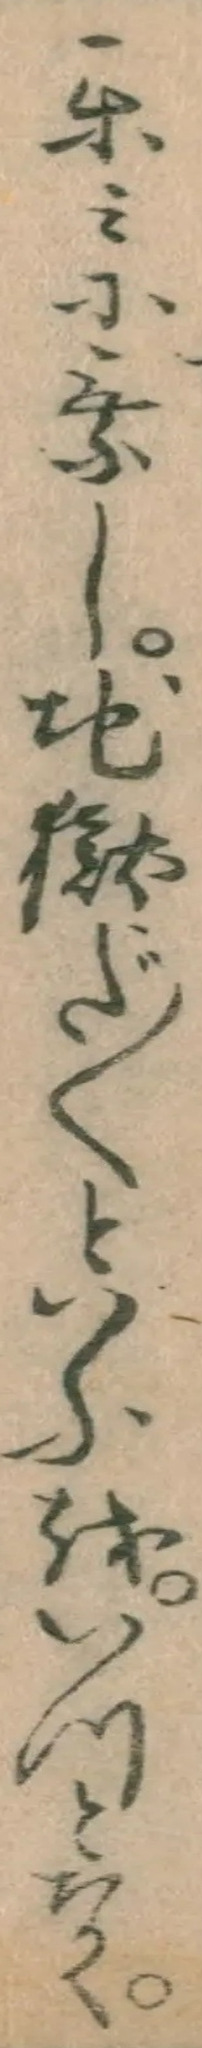楽みに乗し。地獄だ〳〵といふを。いつとなく。
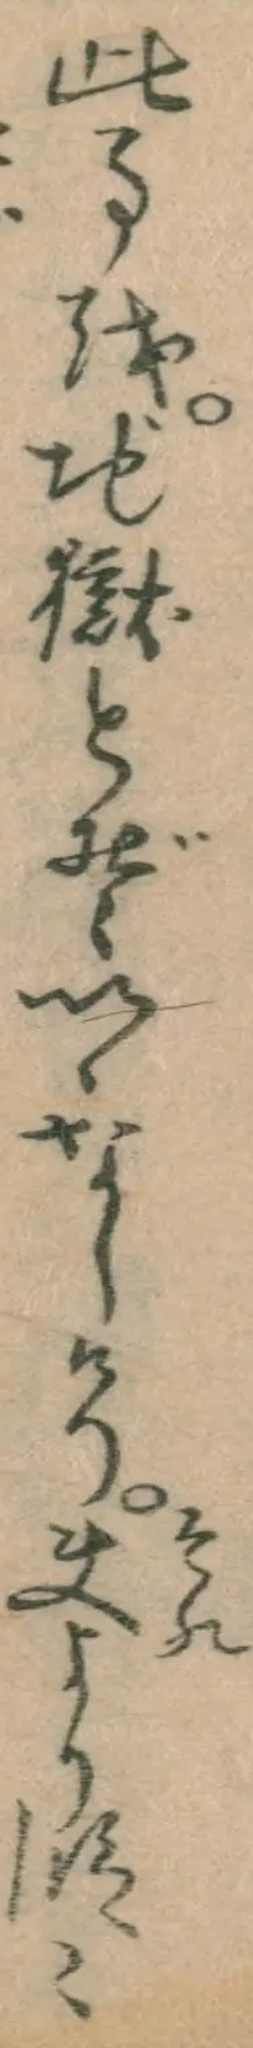此事を。地獄とぞいゝなしけり。夫より段々
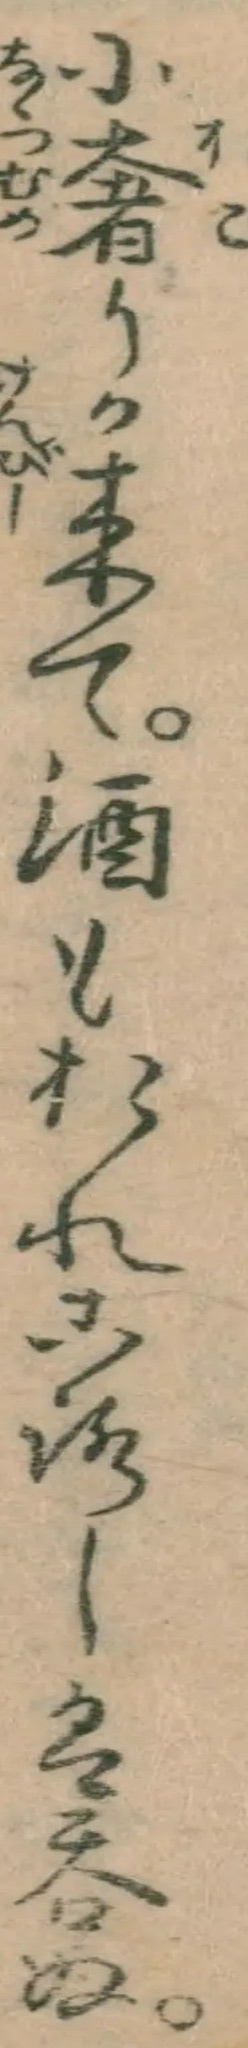に奢りか来て。酒もおれころしは呑ぬ。
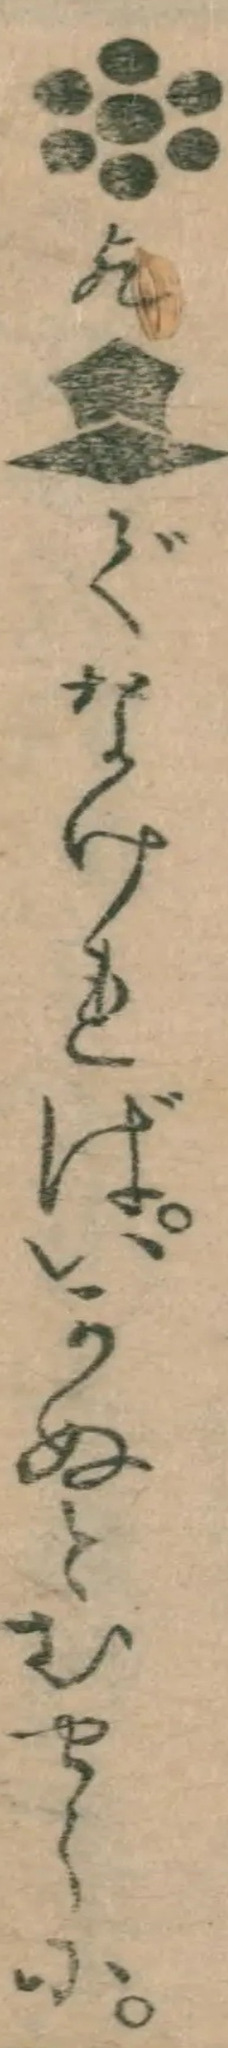かでなければ。いかぬとむせうに。
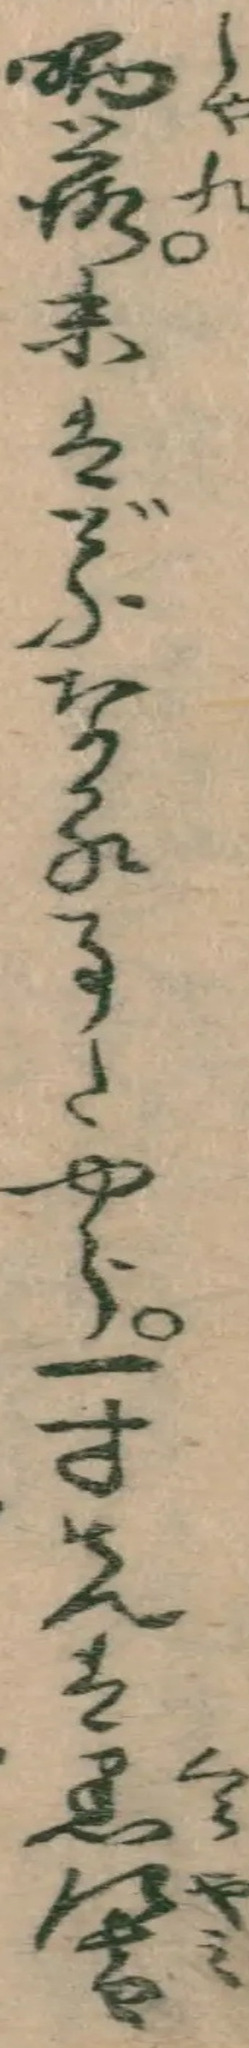晒落。末はどふなる事とやら。一寸先は黒闇
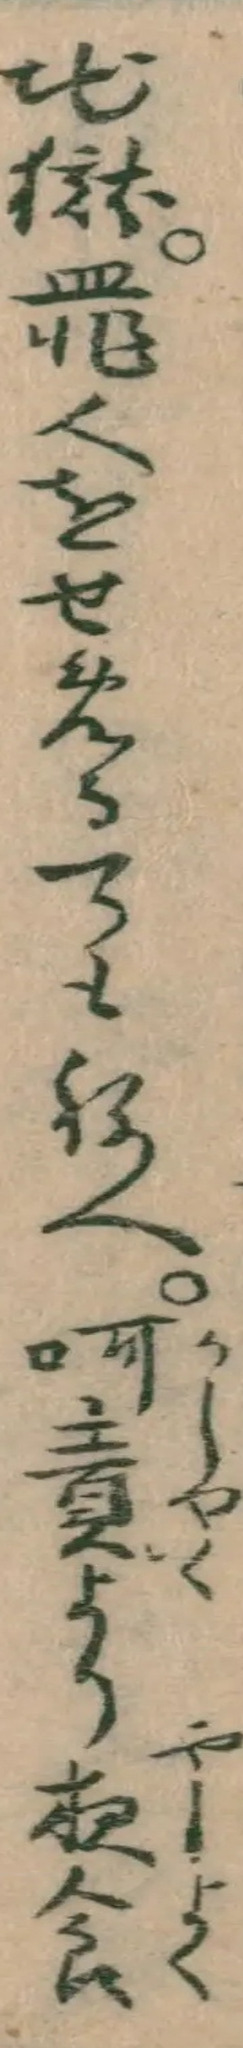地獄。罪人をせめるてもねへ。呵責より夜食
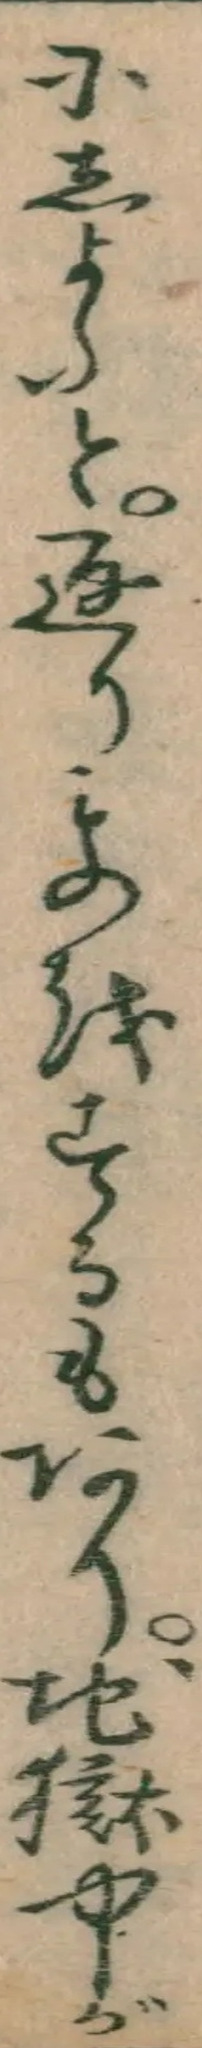にしよふと。通りものをするもあり。地獄中が
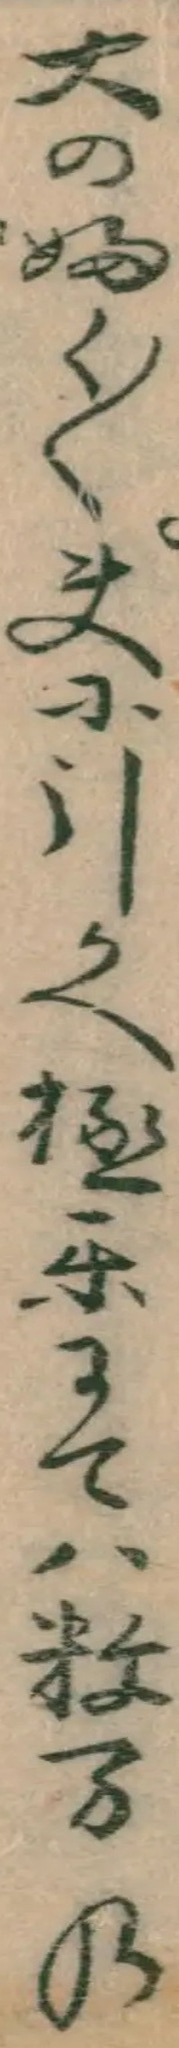大のふく〳〵。夫に引かへ極楽にては数万の
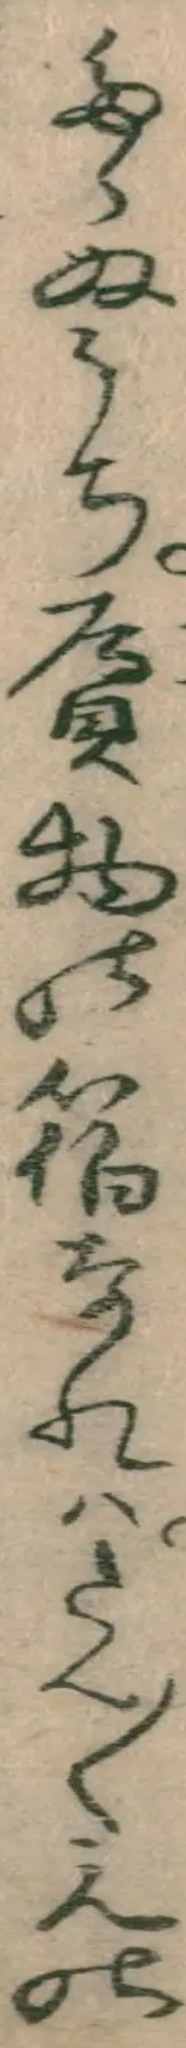たゝぬうち。贋物の箔なれは。たん〳〵元の
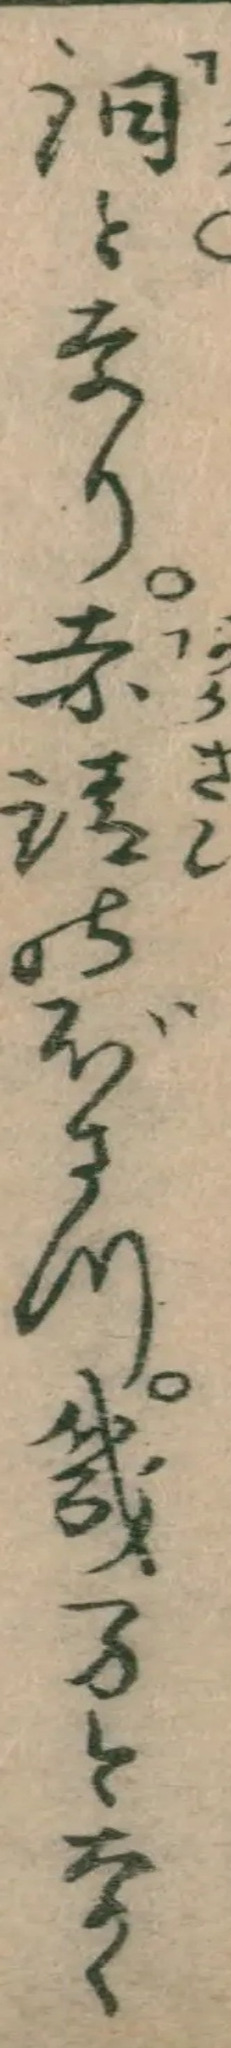銅となり。赤錆のぼさつ。幾万となく
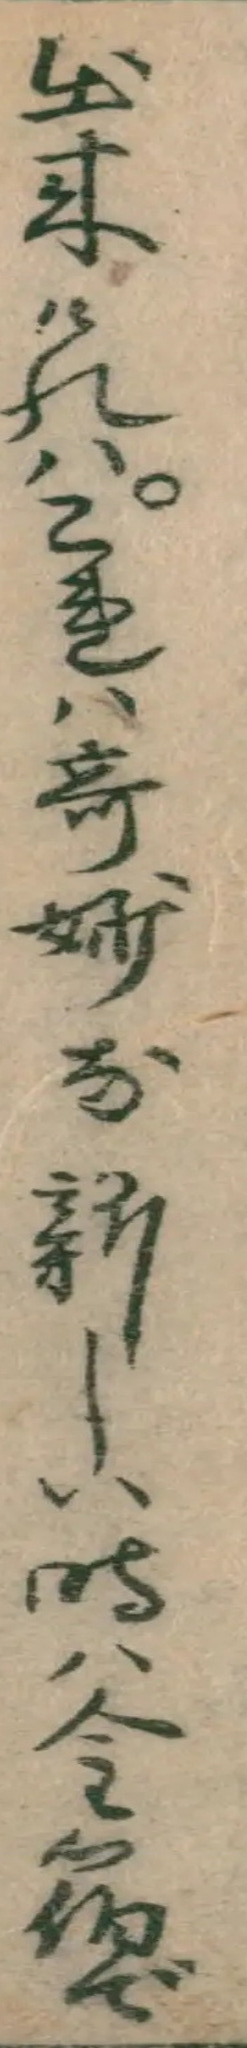出来けれは。これは奇妙な新しい時は金箔で

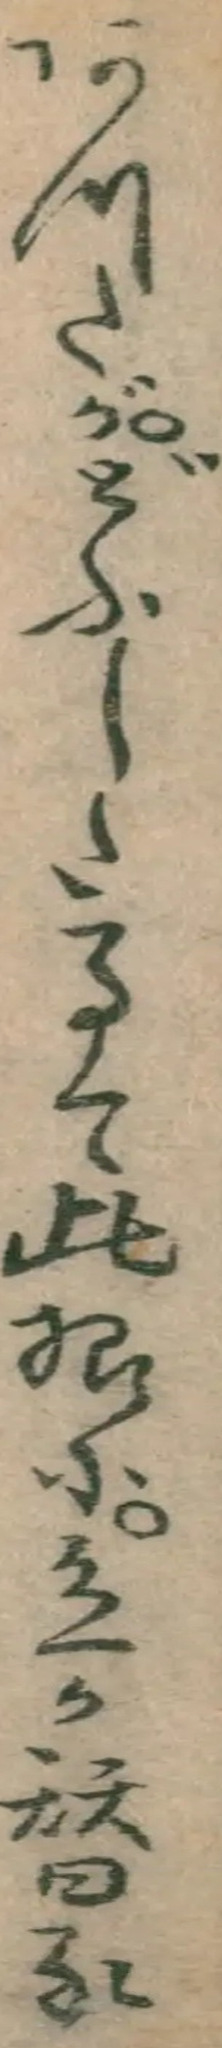あつたが。どふした事て此様に。色か替る
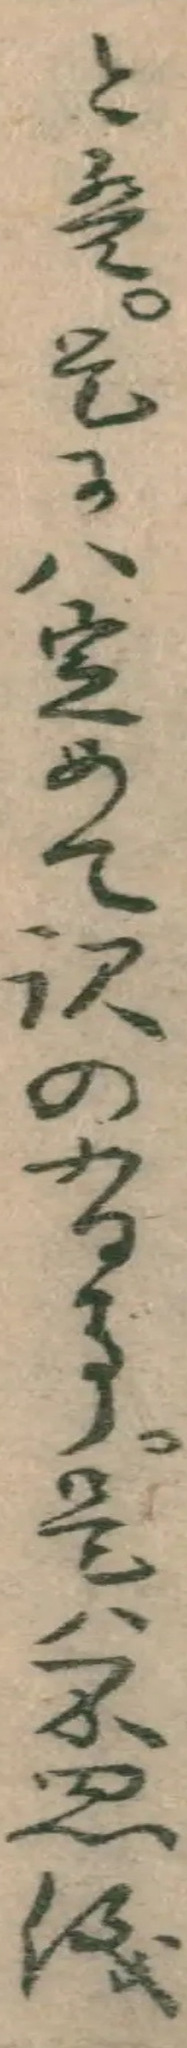とは。是には定めて訳の有事。是は不思議
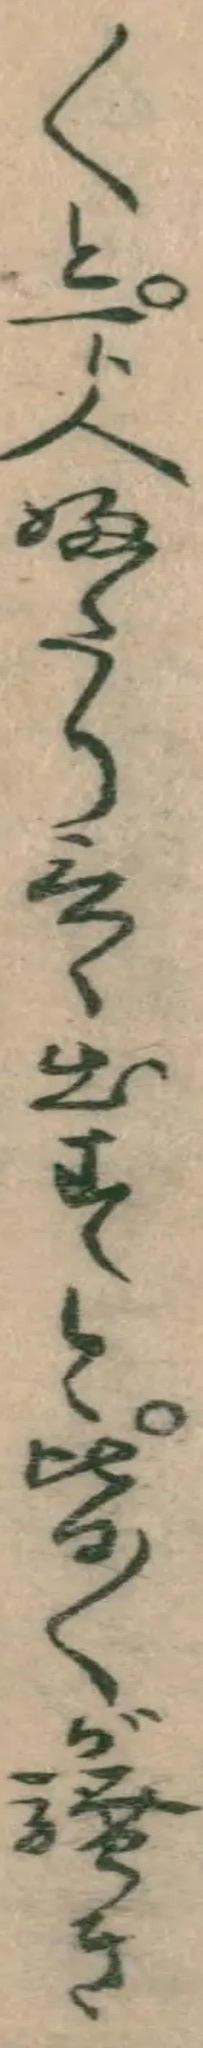〳〵と。一人ふたり言ゝ出すと。皆々が騒き
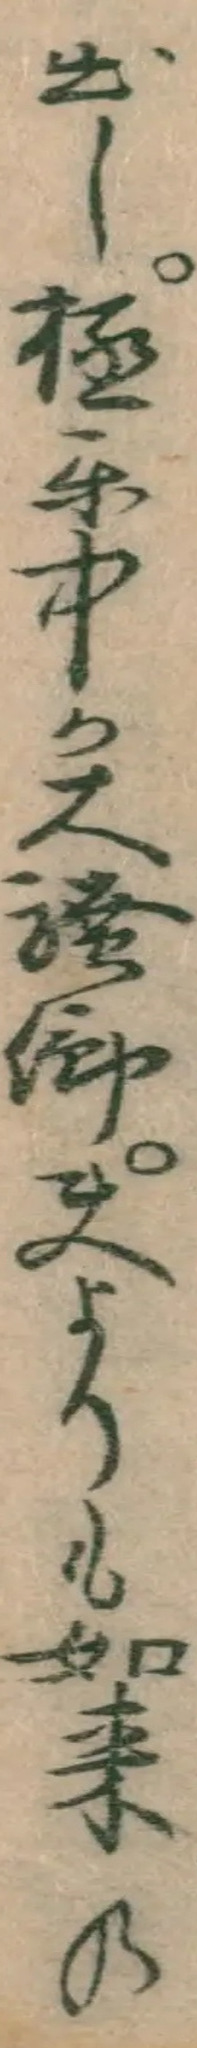出し。極楽中か大騒動。夫よりも如来の
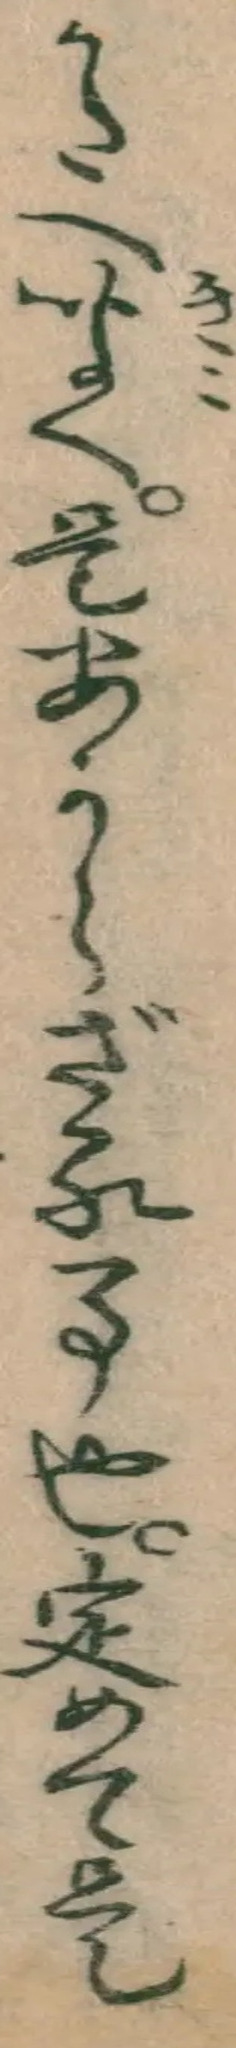かたへ聞へ。是安からざる事也。定めて是
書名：翻草盲目
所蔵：国立国会図書館 National Diet Library, JAPAN
